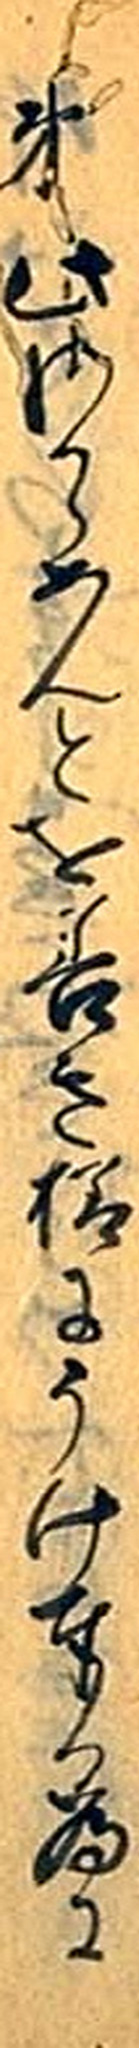弟此さからめんとを善き様にうけ奉る為に
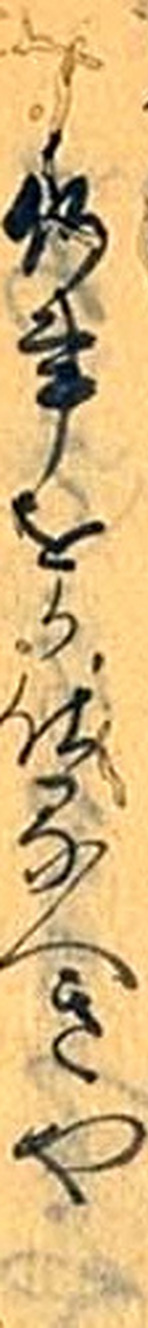何事をか仕るへきや
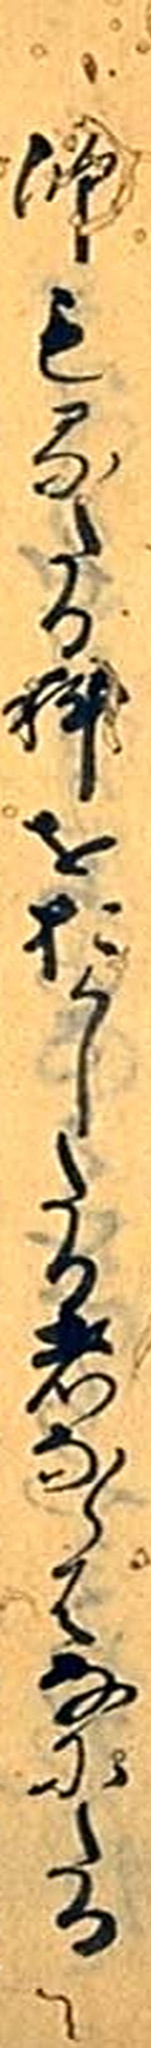師もるたる科をおかしたる者ならはなにたる
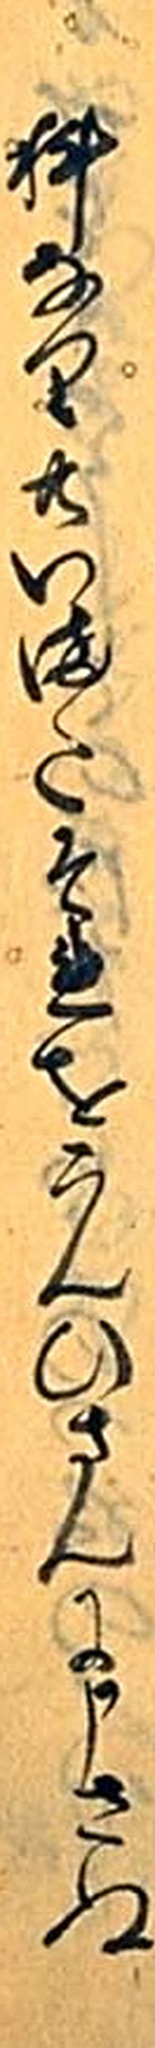科なり共いまたそれをこんひさんに申さぬ
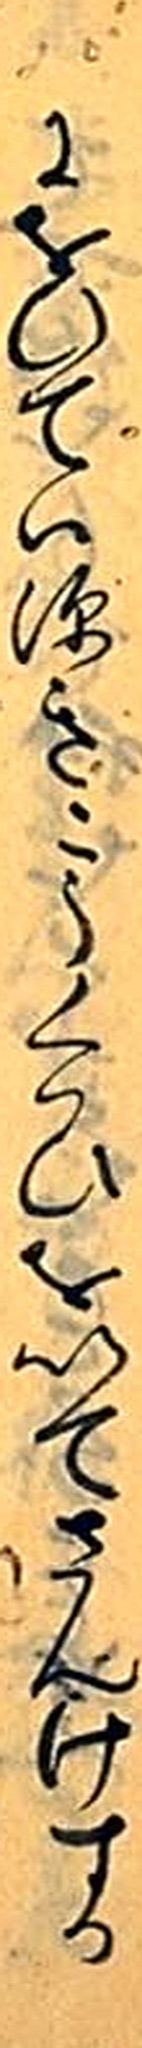にをひては深きこうくはひを以てさんけする
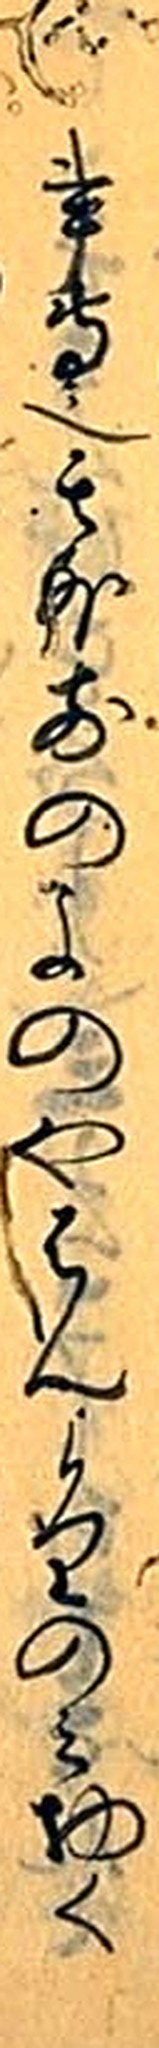事専也其外前のよのやはんよりのみ物く
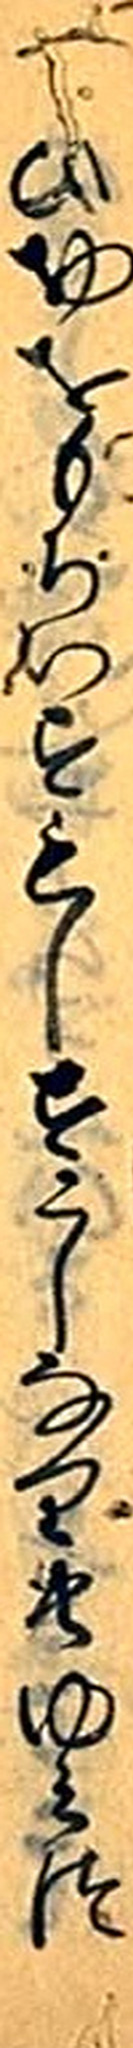ひ物をもちいすもしすこしなり共ゆみつ
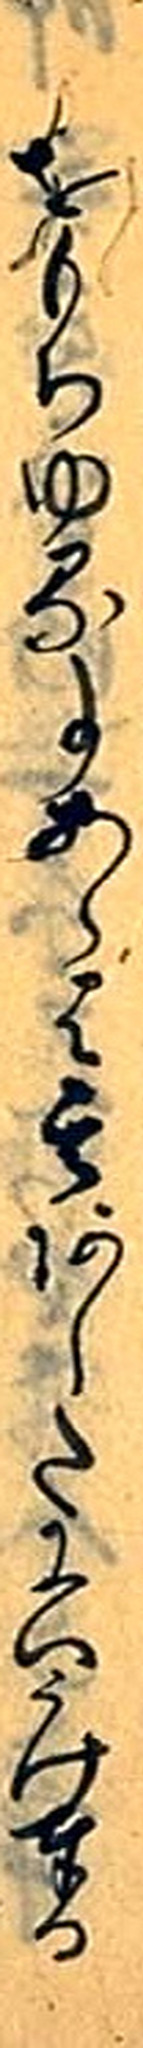をもちゆる事あらは其あしたにはうけ奉る
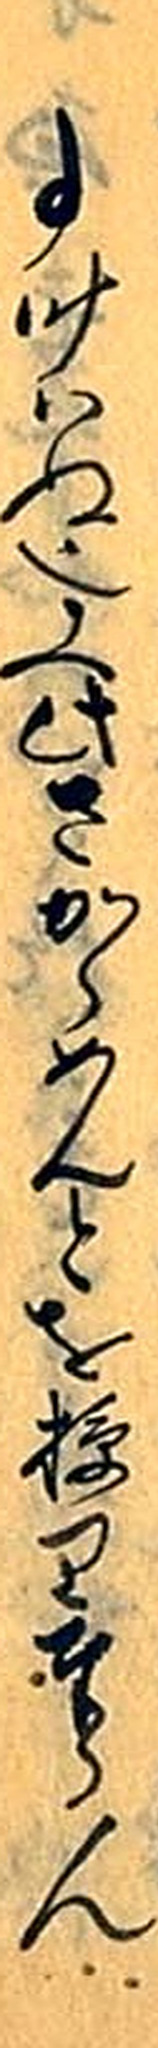事叶はぬ也又此さからめんとを授り奉らん
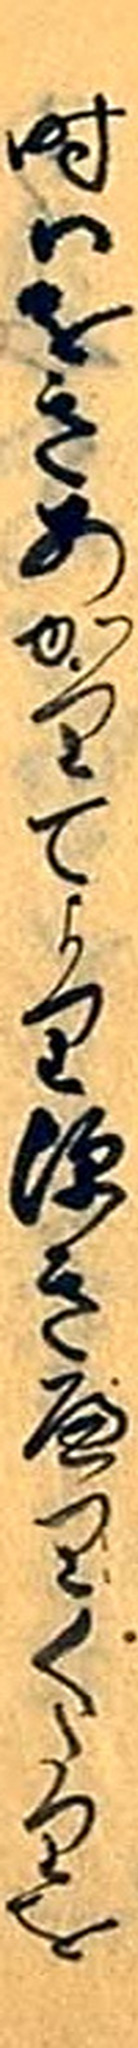時はをきあかりてより深きへりくたりを
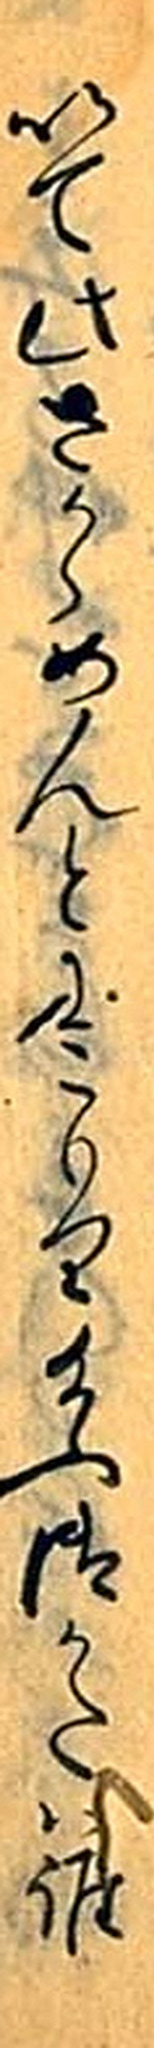以て此さからめんとにこもり給ふ御かたは誰
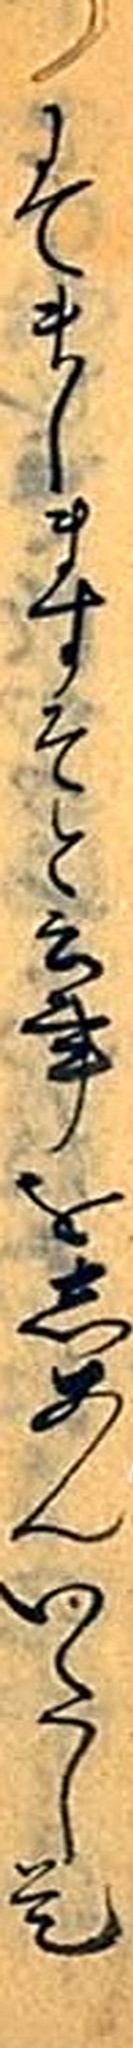にてましますそと云事をしあんいたし是
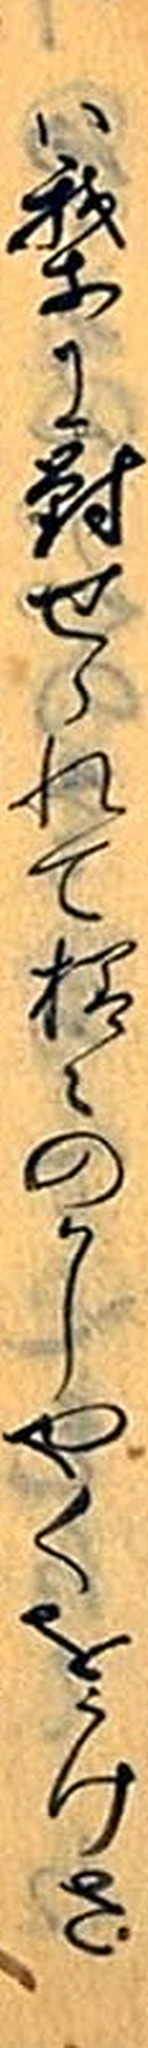は我等に対せられて様々のかしやくをうけさ
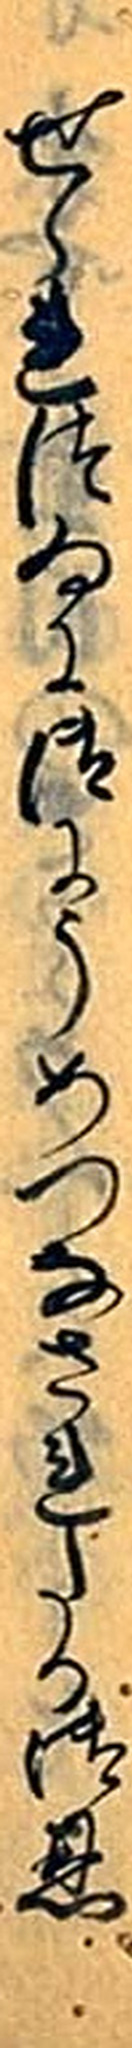せられつゐに御にうめつなされたる御恩
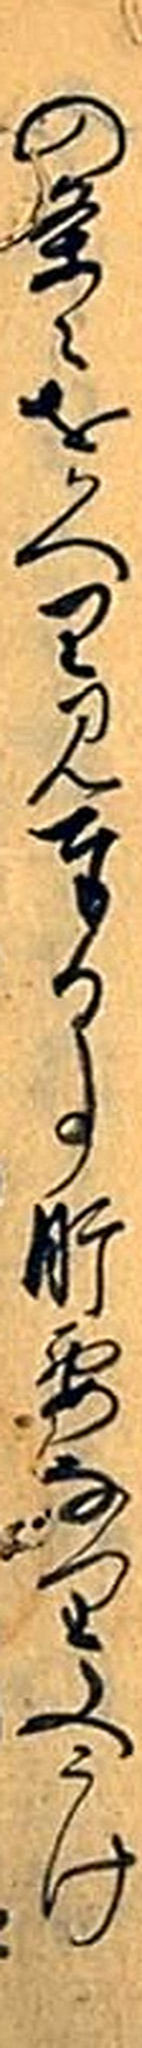の条々をかへり見奉る事肝要なり又うけ
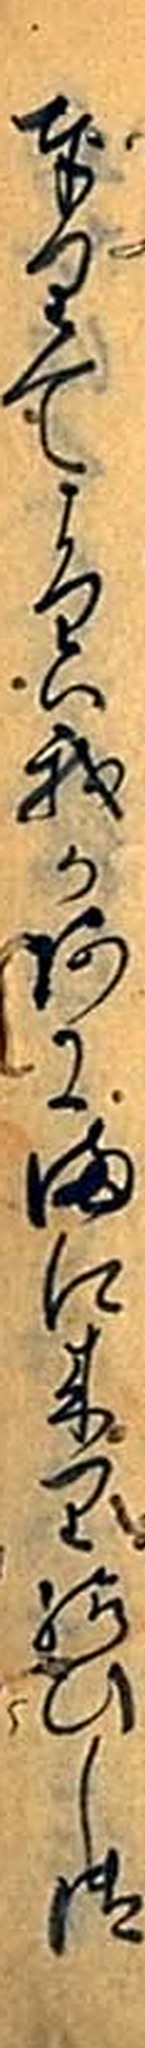奉りてよりは我かあにまに来り給ひし御
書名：ドチリナ・キリシタン
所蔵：東京大学総合図書館 / General Library in the University of Tokyo
